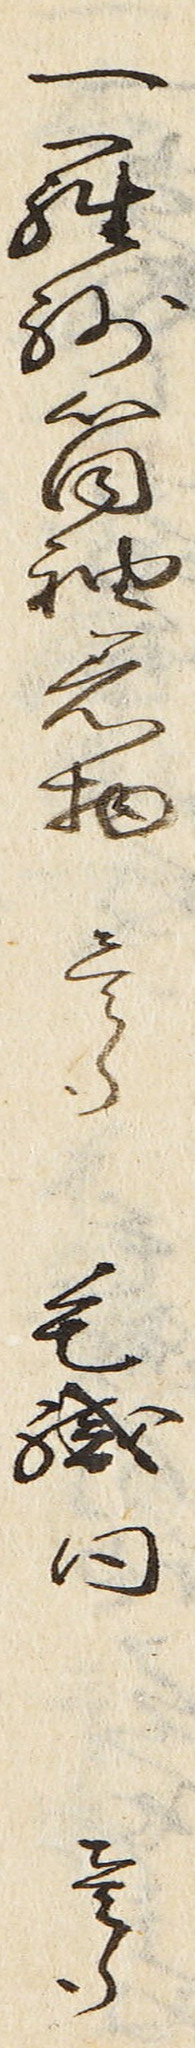一羅紗筒袖着物壱ツ毛織同壱ツ
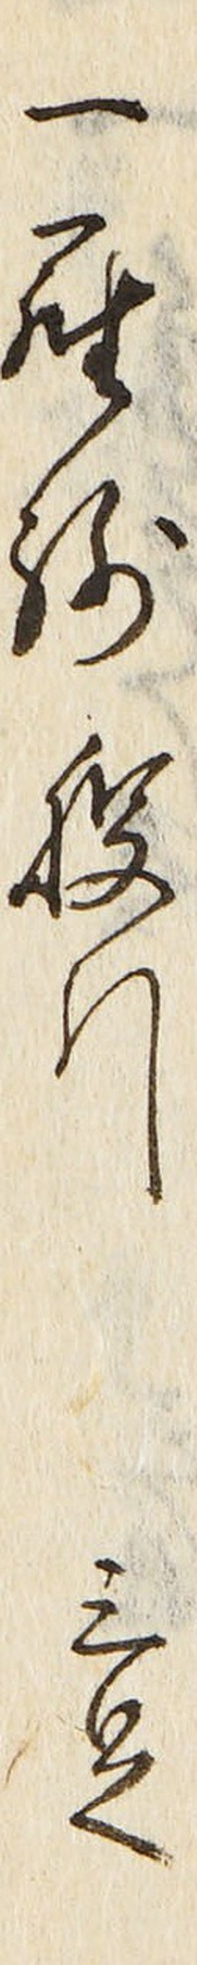一羅紗股引三足
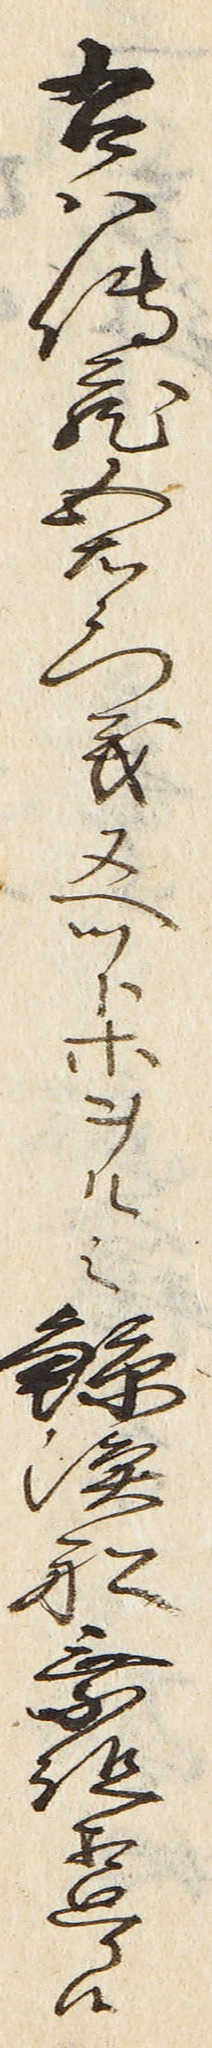右は伝蔵五右衛門義ヌヘツトホヲル之鯨漁船乗組相廻り候
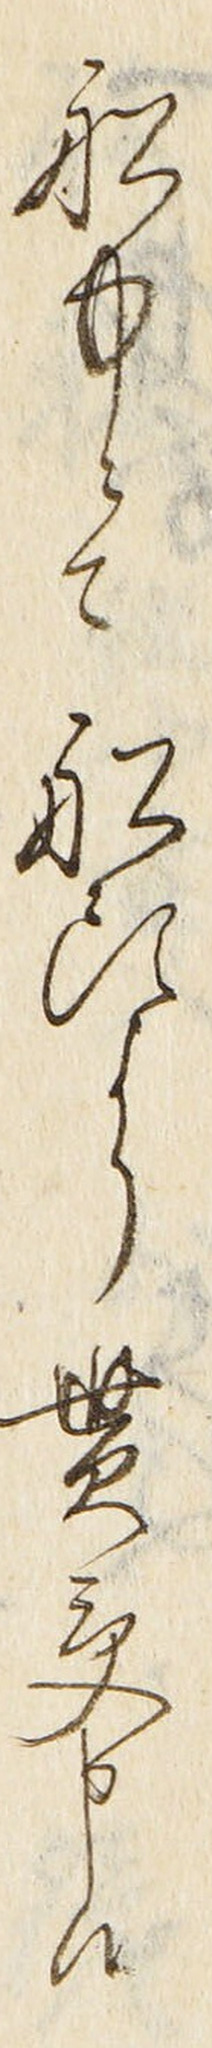船中にて船頭より貰受申候
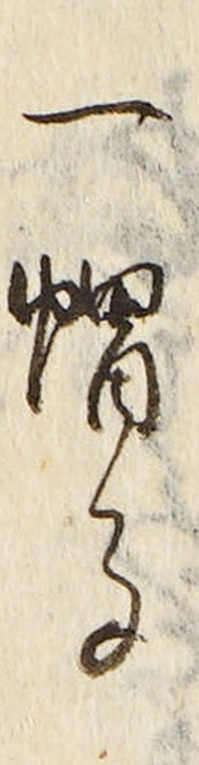一帽子
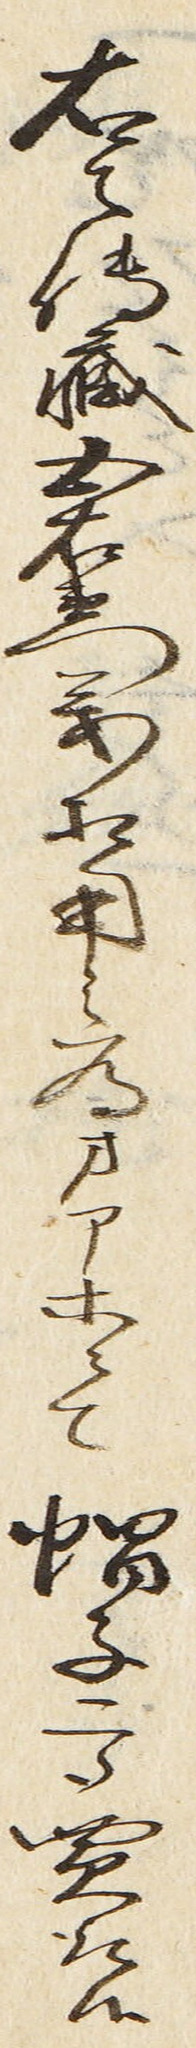右は伝蔵五右衛門義相用之為オアホにて帽子二ツ買取候
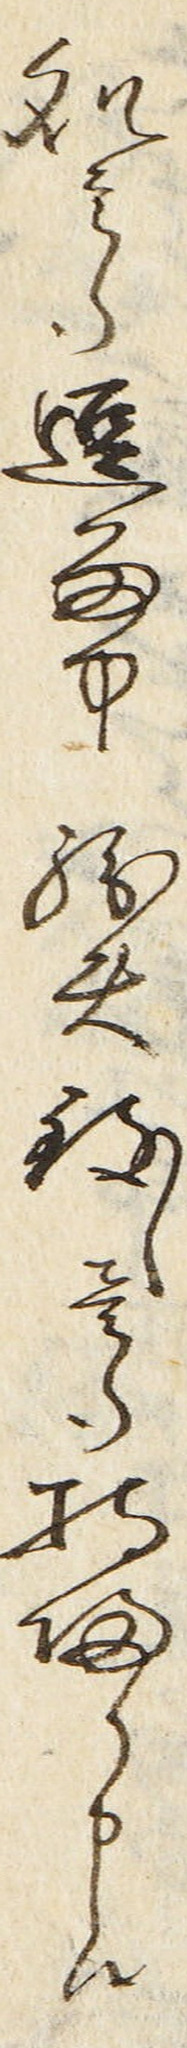処壱ツ逗留中紛失致し持帰り申候
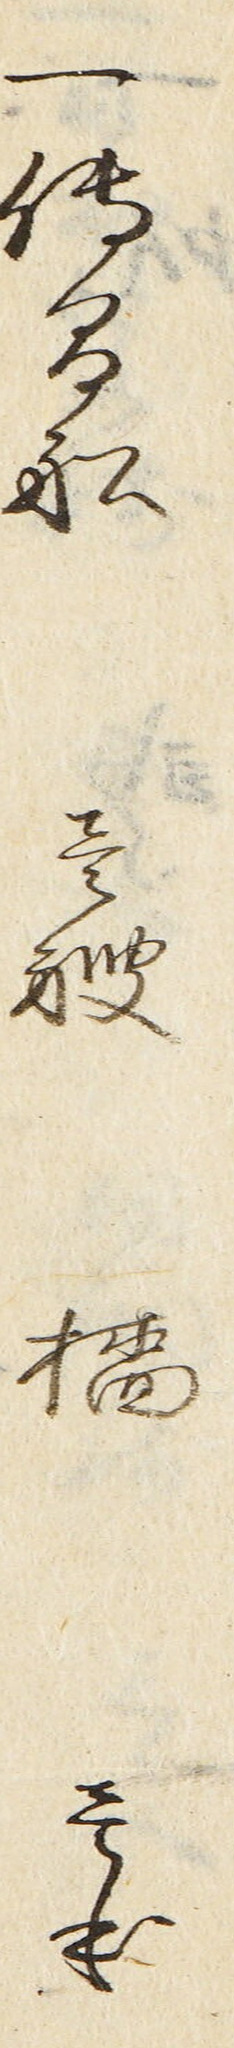一伝間船壱艘檣壱本

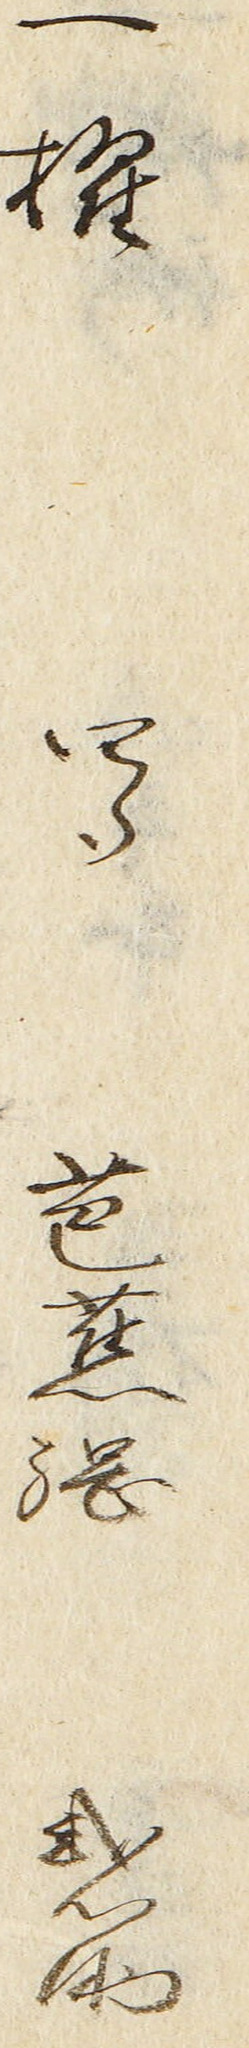一櫂四ツ芭蕉綱弐筋
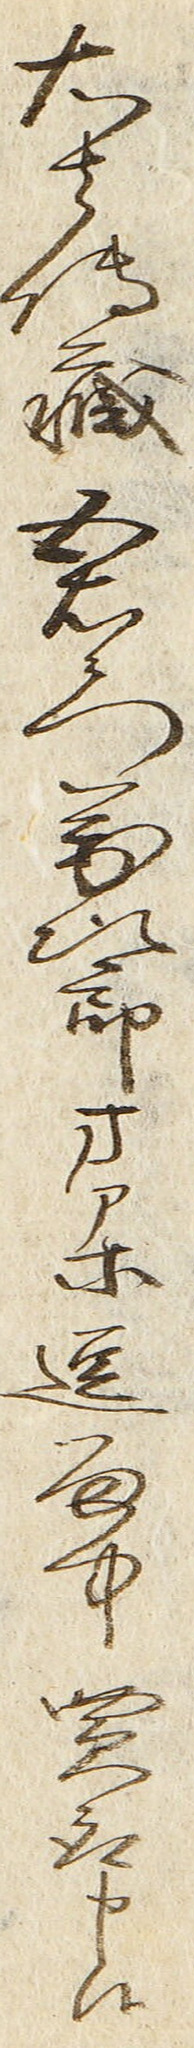右は伝蔵五右衛門万次郎オアホ逗留中買取申候
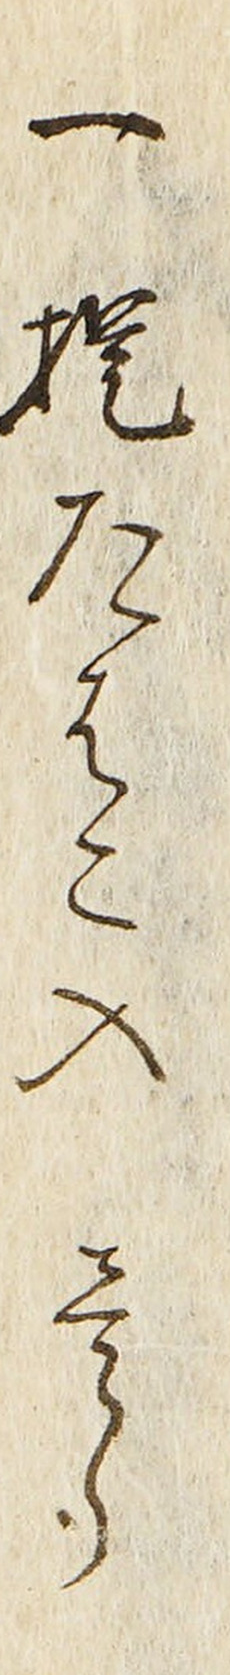一提たはこ入壱ツ
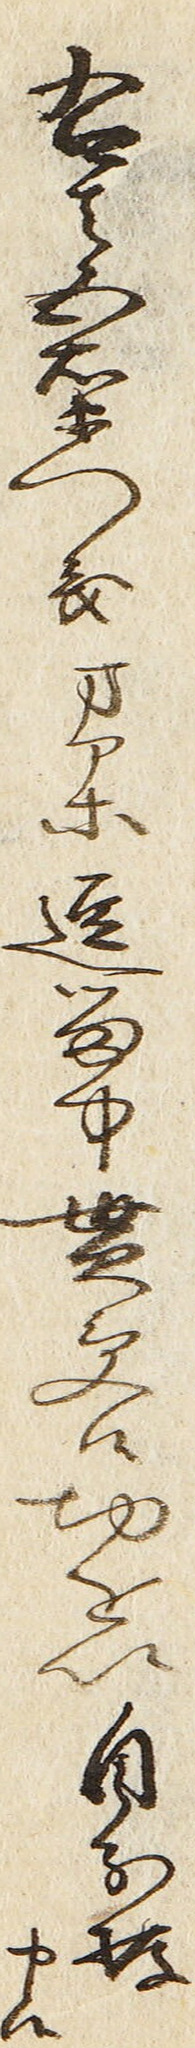右は五右衛門義オアホ逗留中貰受候切を以自分拵申候
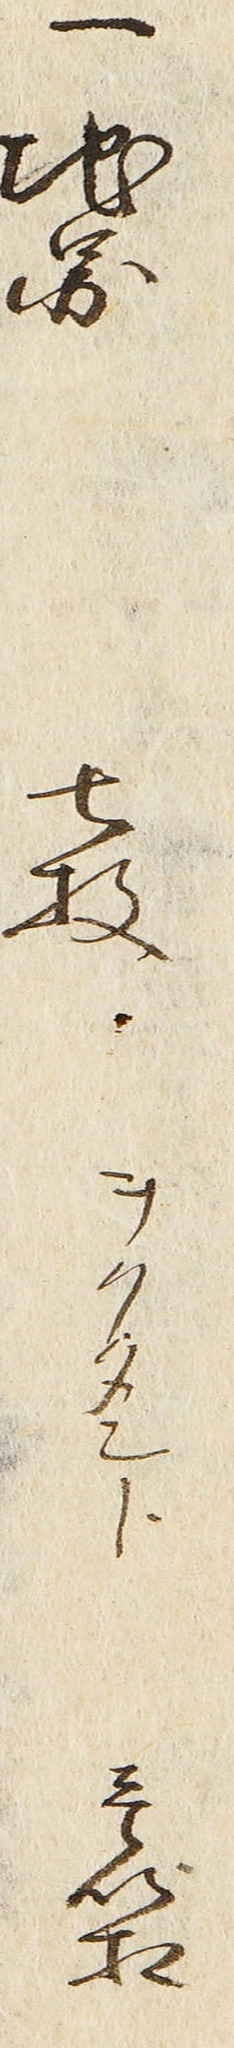一地図七枚ヲクタント壱箱
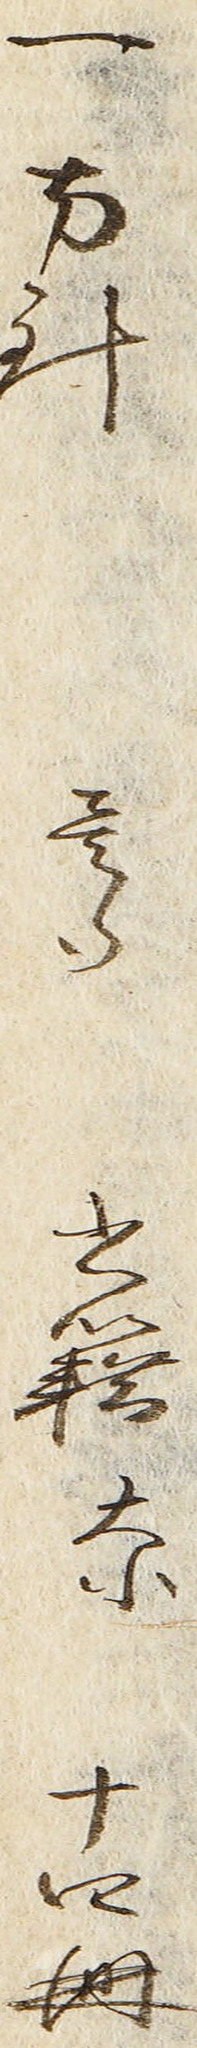一方針壱ツ書籍大小十四冊
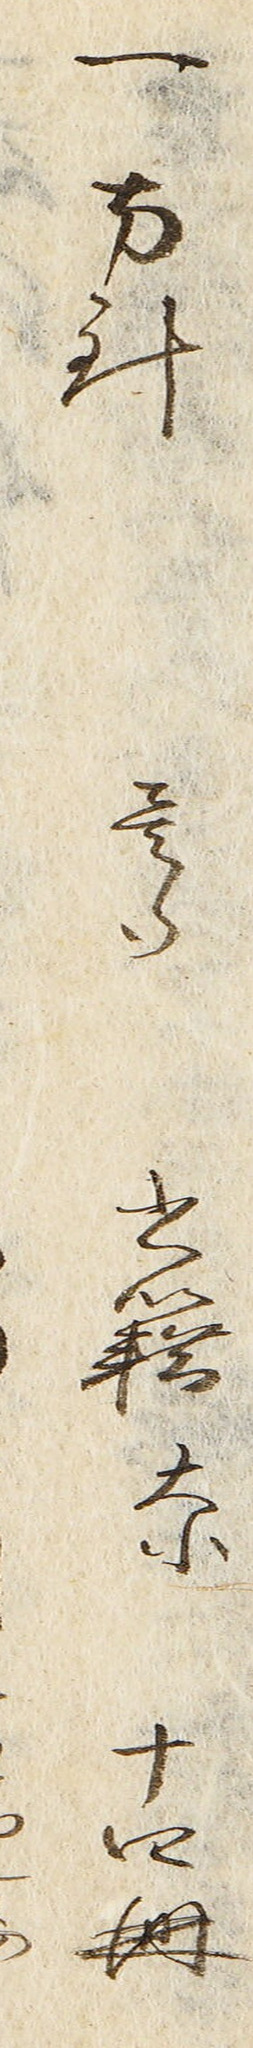一方針壱ツ書籍大小十四冊
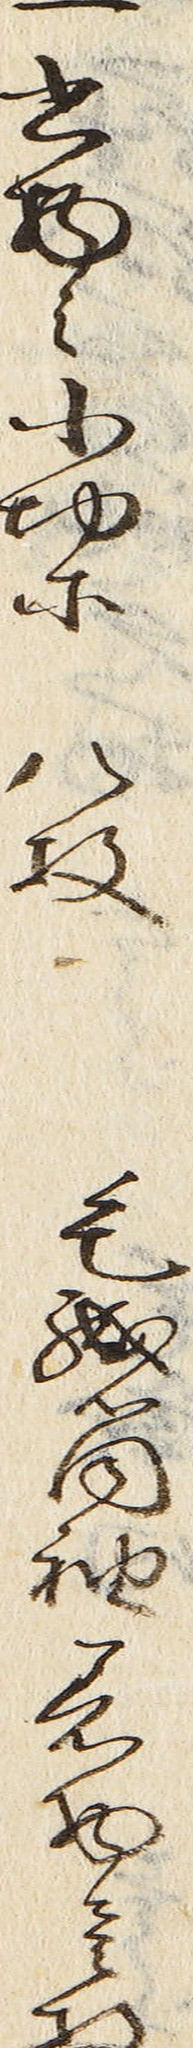一書物之小切など八枚毛織筒袖着物壱枚
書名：土佐中浜万次郎漂流記
